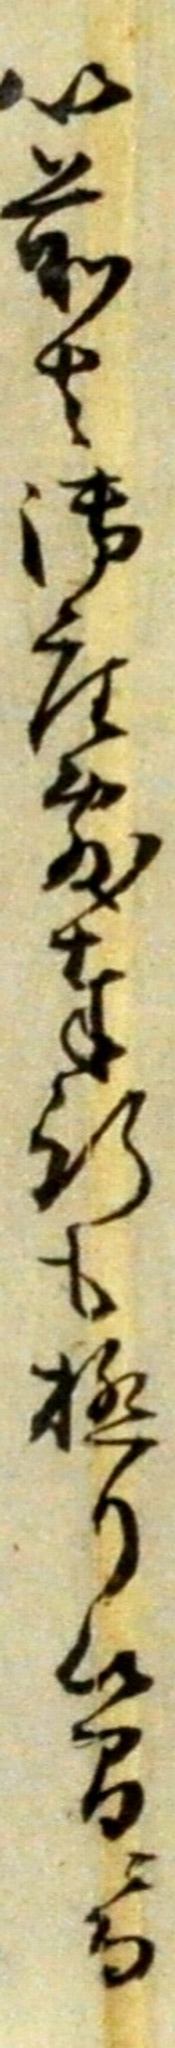以前は御座敷奉行も極り候間にて
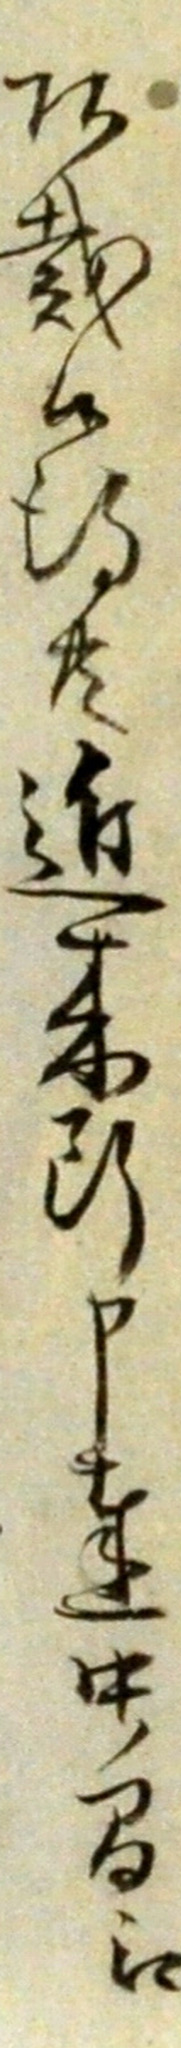頂戴候得共近来断申達中ノ間え
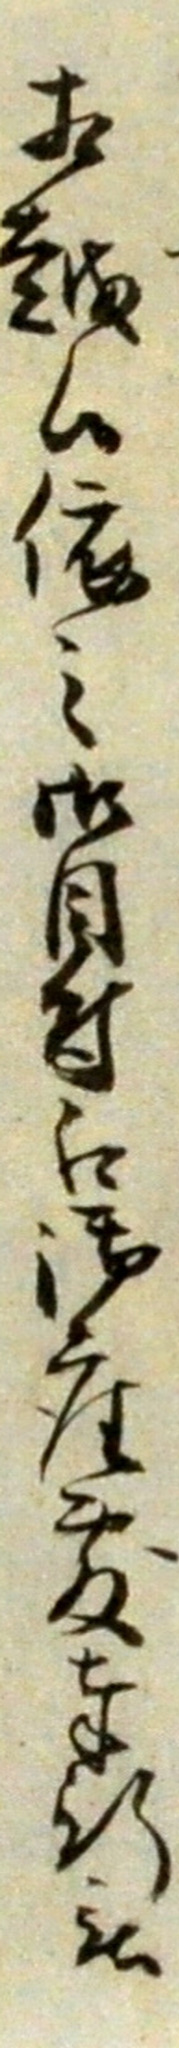相越候依之御目付え御座敷奉行被
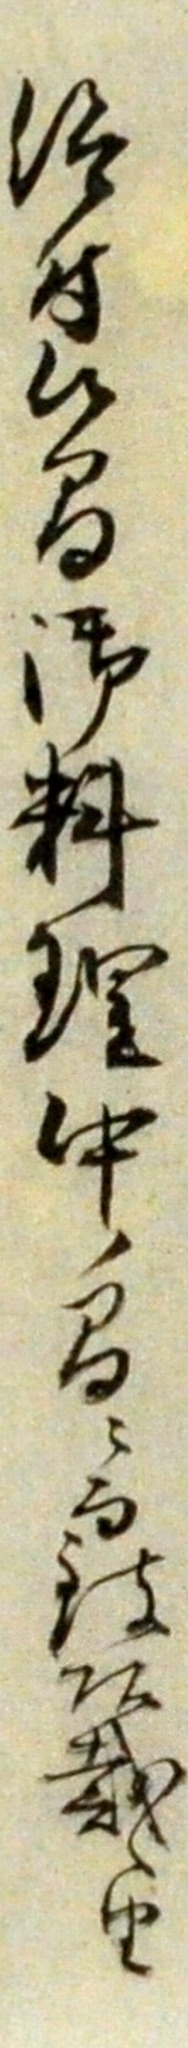仰付候間御料理中ノ間にて致頂戴候由
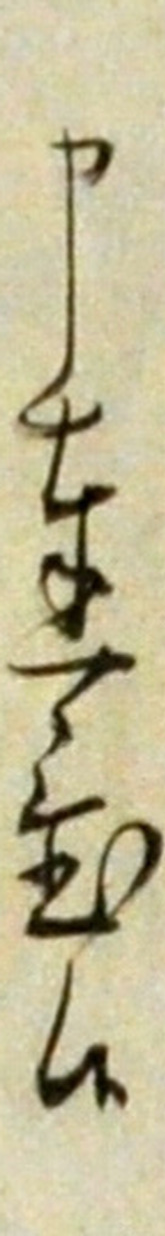申達置候
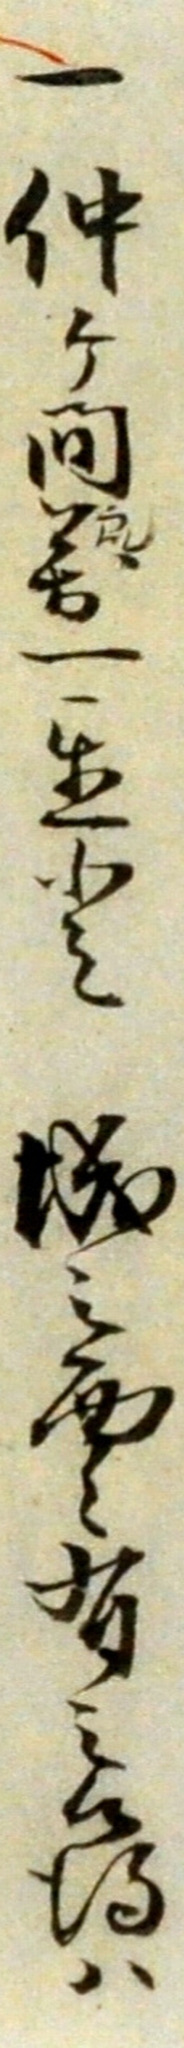一仲ヶ間衆万一遅登城之面々有之候得は
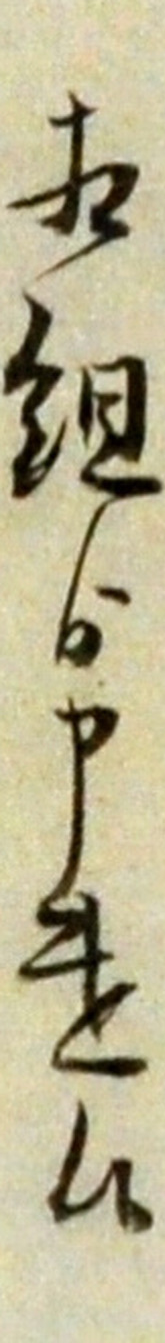相組ゟ申遣候
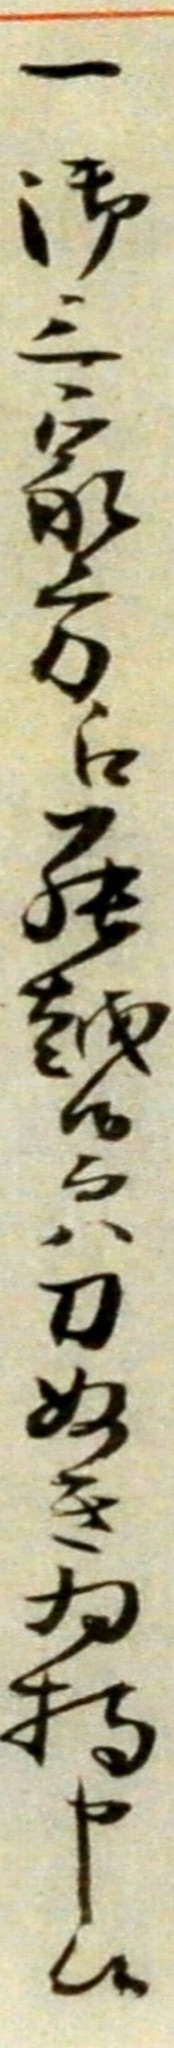一御三家方え罷越候ては刀ぬき為持申候
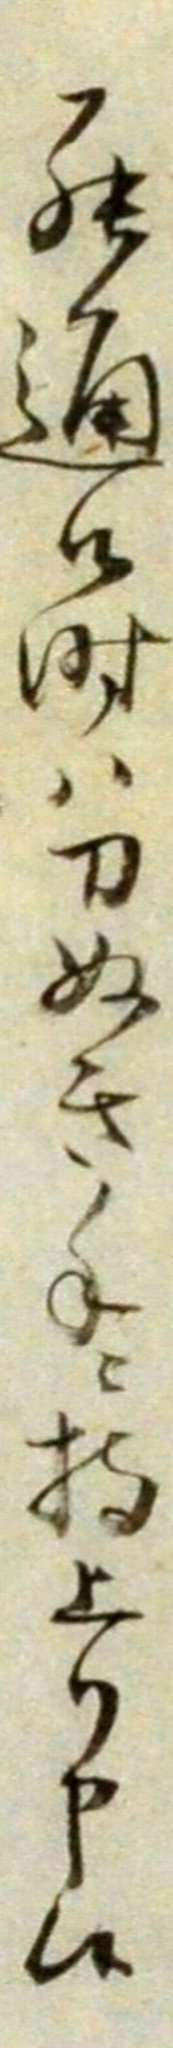罷通候時は刀ぬき手に持上り申候
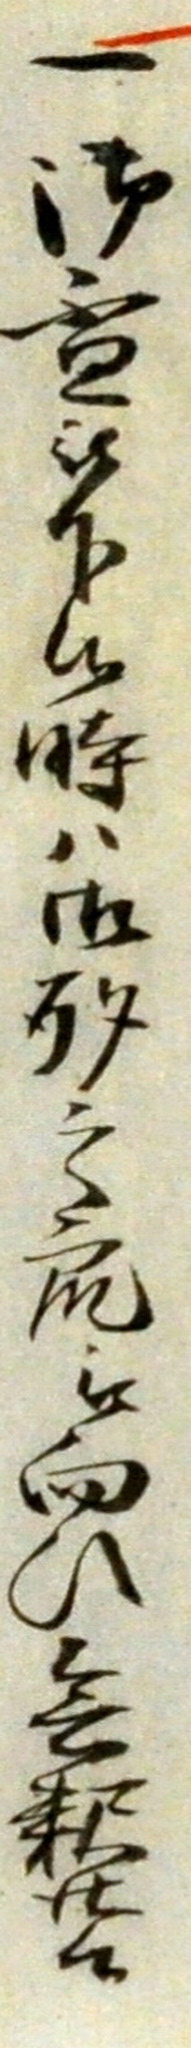一御盃被下候時は御酌之衆え向ひ会釈仕候
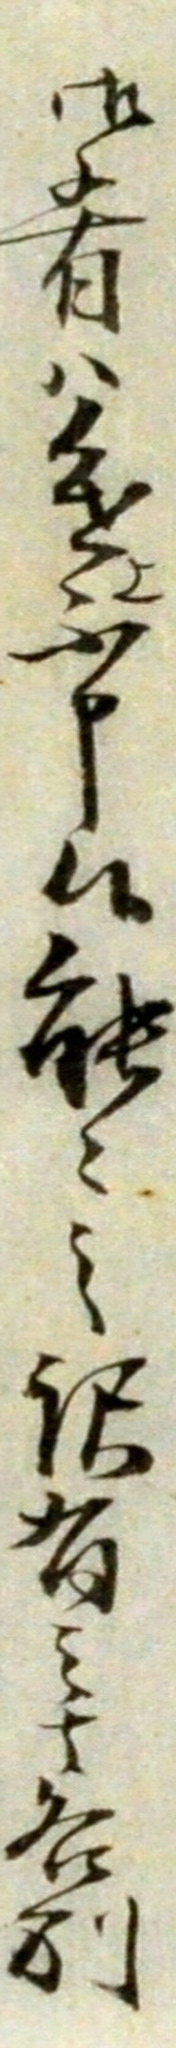御肴は進上不申候能々之訳有之は各別
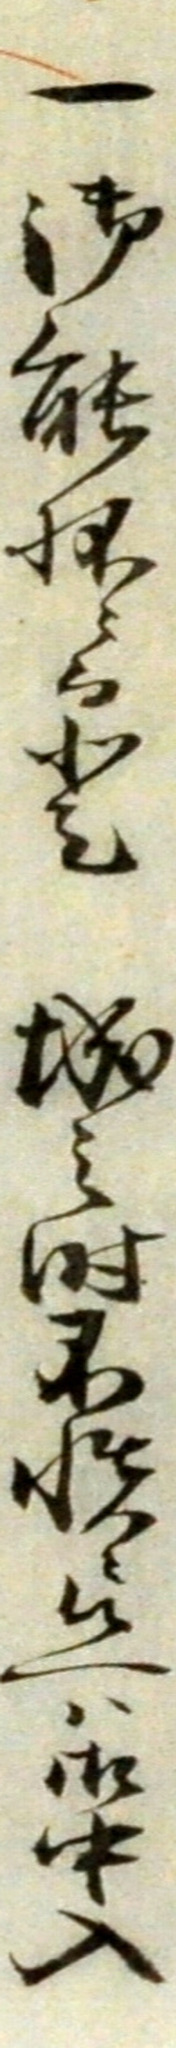一御能抔にて登城之時不快に候へは御中入
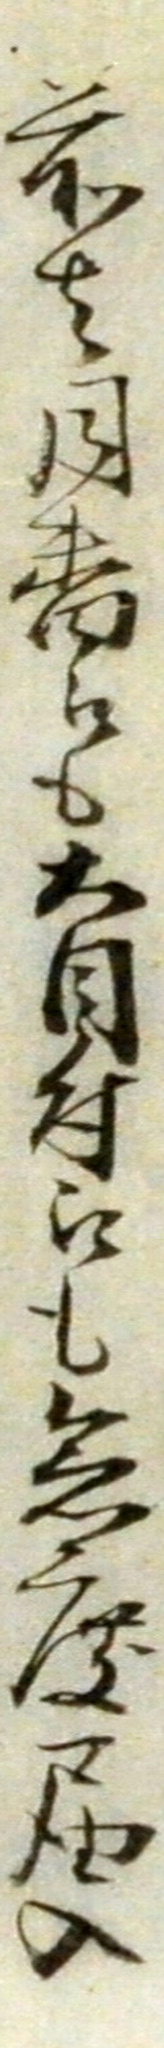前は月番えも大目付えも急度届入
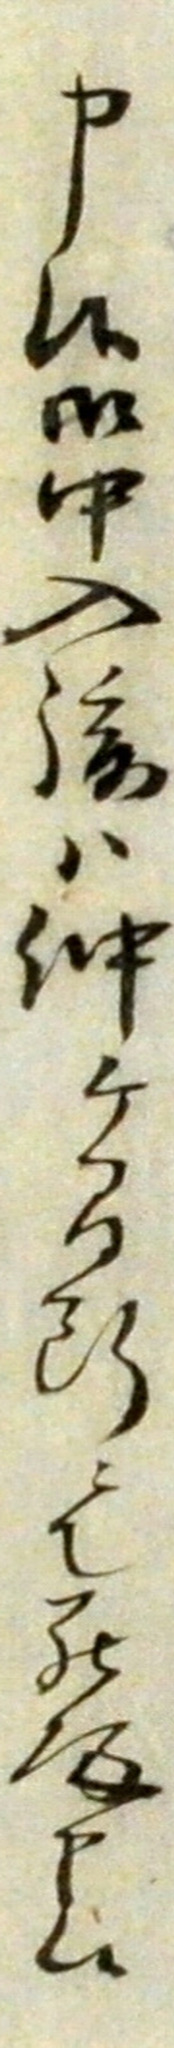申候御中入後は仲ヶ間断にて罷帰申候
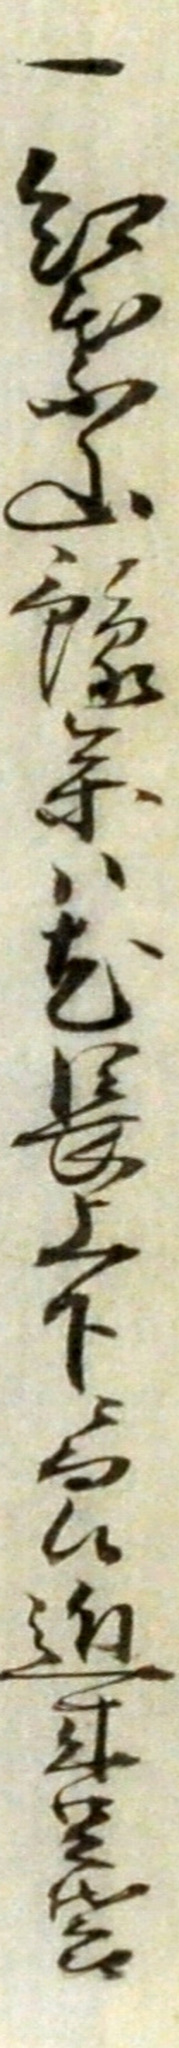一紅葉山予参は尤長上下にて候近来足袋
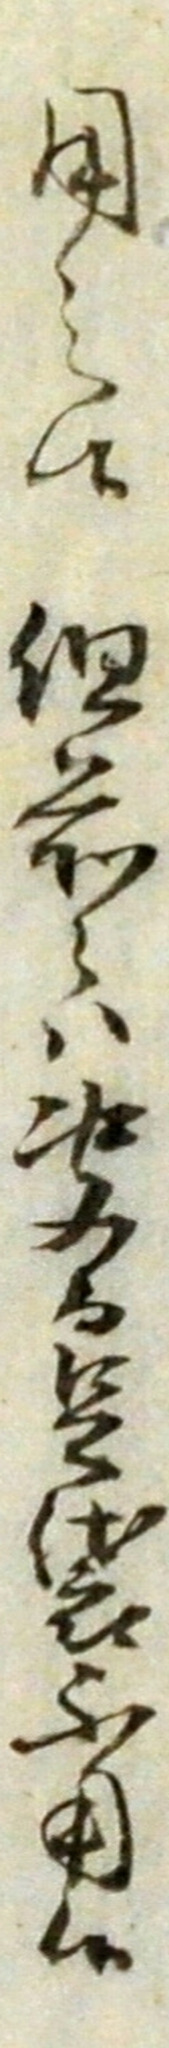用之候但前々は決て足袋不用候
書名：申合帳〔一括〕
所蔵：伊那市立高遠町図書館・合同会社AMANE
